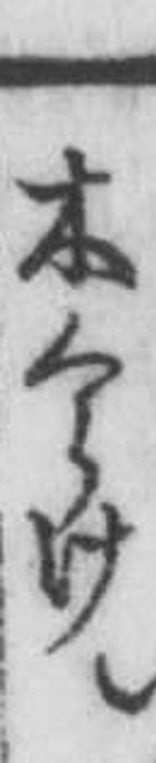木くらげ
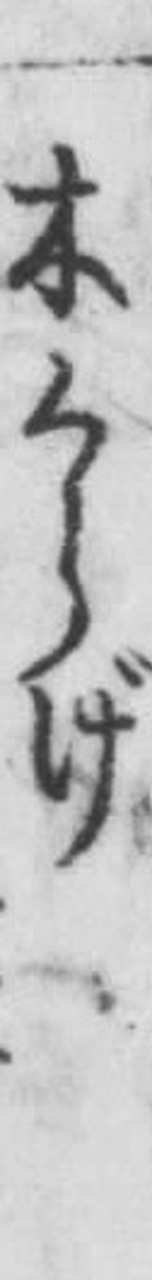木くらげ
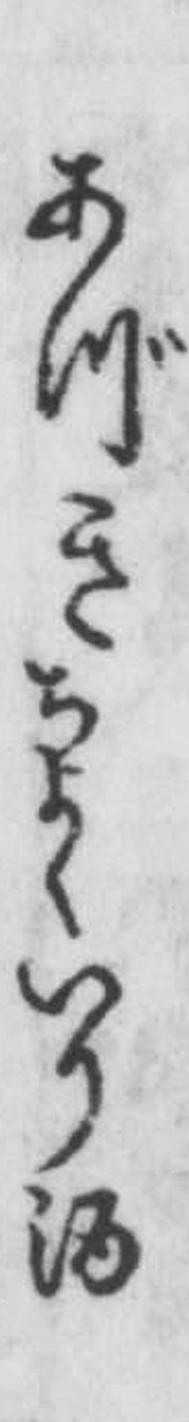あづきちよくいり酒
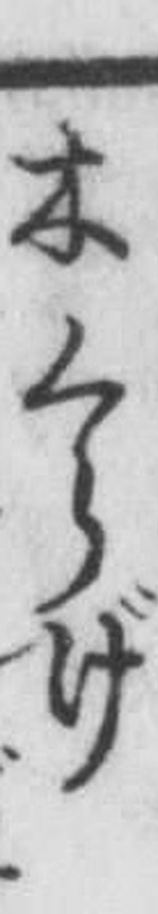木くらげ
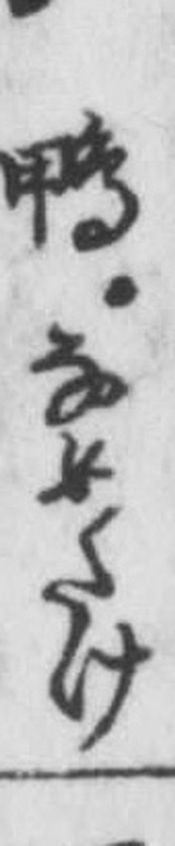鴨なめたけ雁
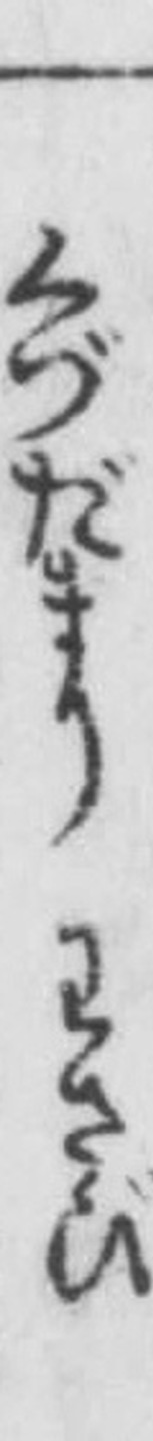くづだまりわさび
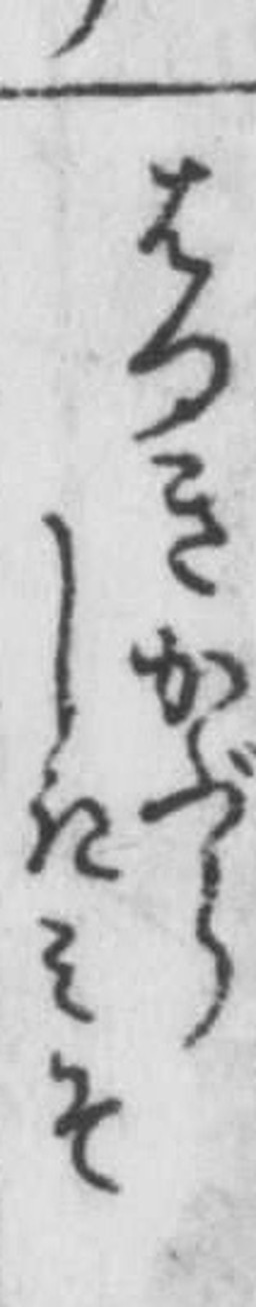しきミそ
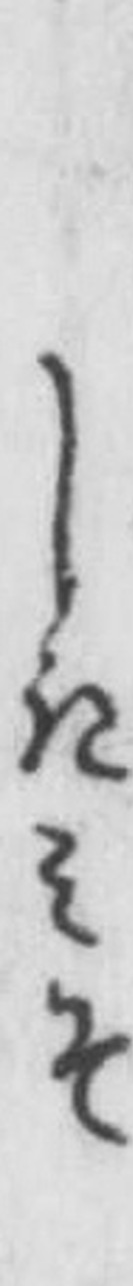しきミそ
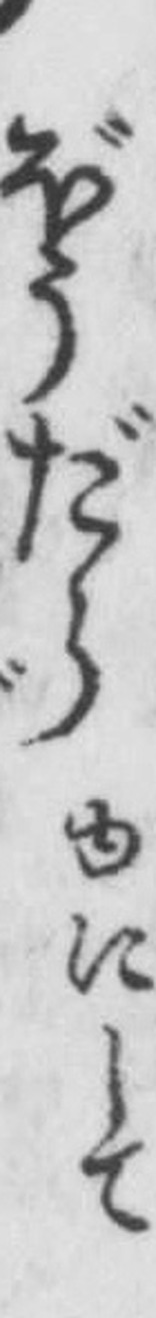ぼうだらゆにして
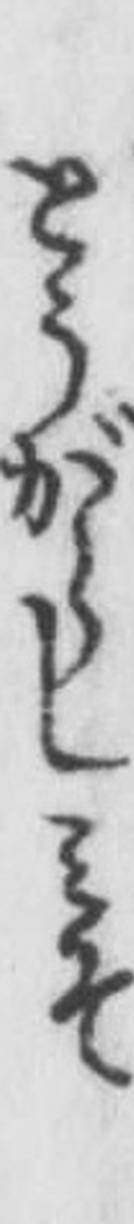とうがらしミそ
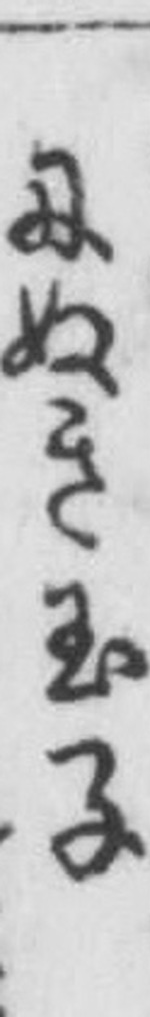にぬき玉子

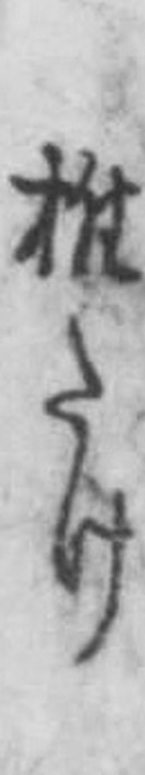椎たけ
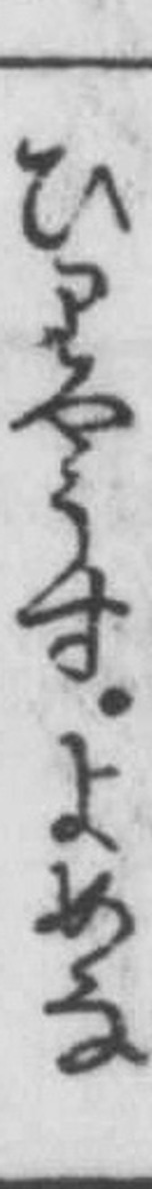煮物ひりやうすよめな
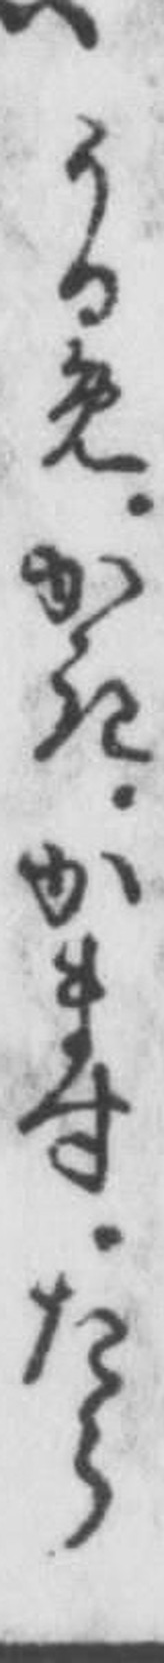時うるめかきかますたら
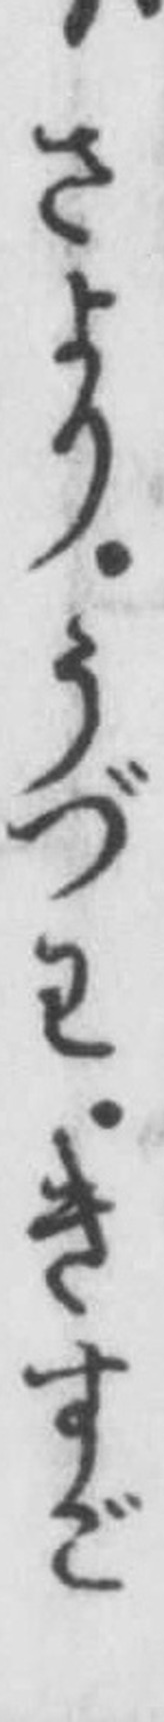物さよりうづきすご
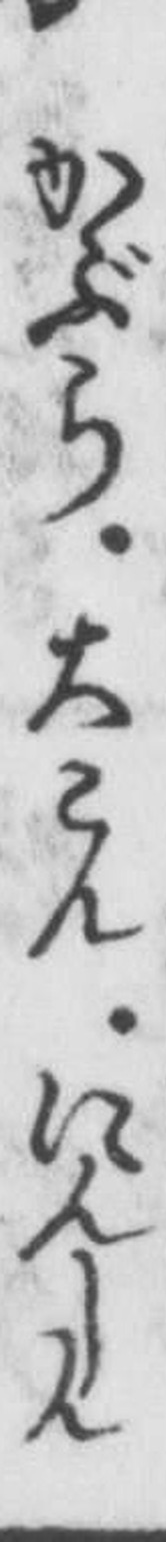かぶら大こんにんしん
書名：当世料理筌
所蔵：大阪府立大学学術情報センター 国文学研究資料館
